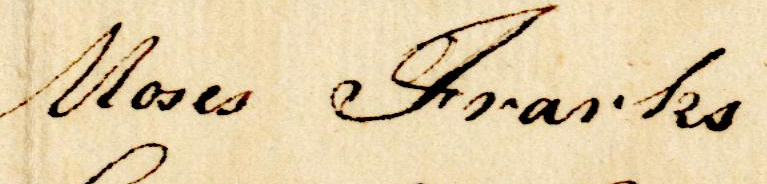Moses Franks
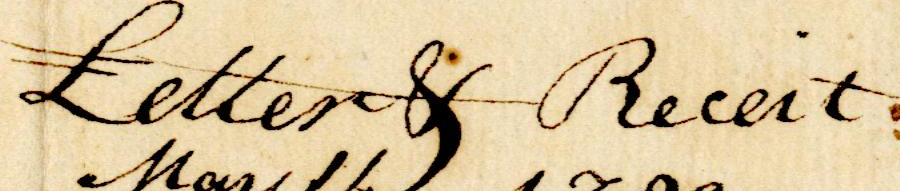Letter & Receit
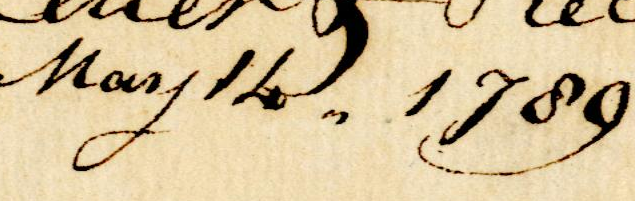May 14 1789
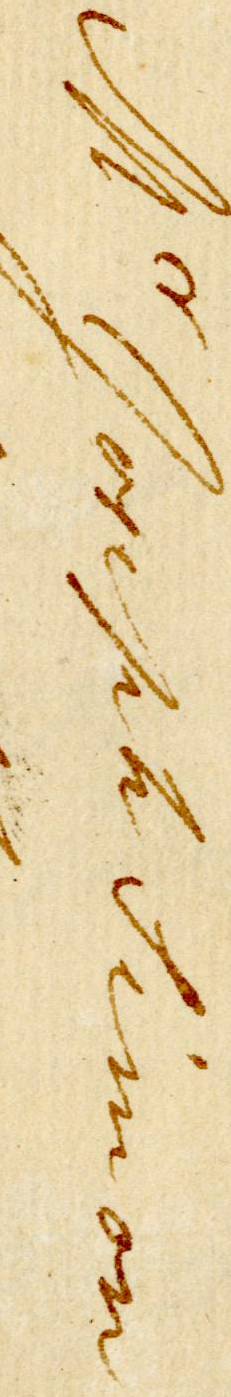M^r Joseph Simon
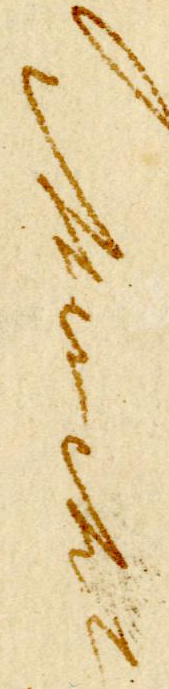Merch^t
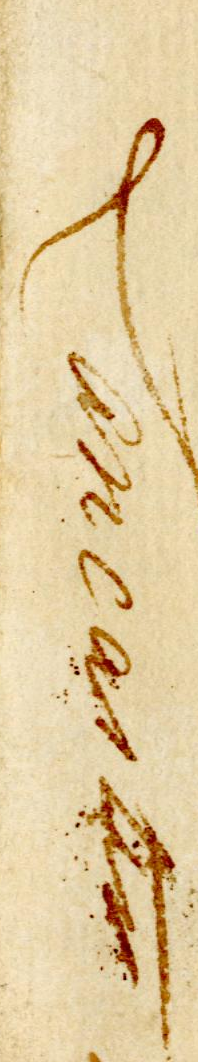Lancaster
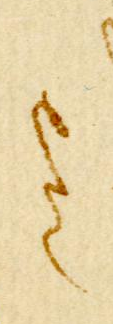in
